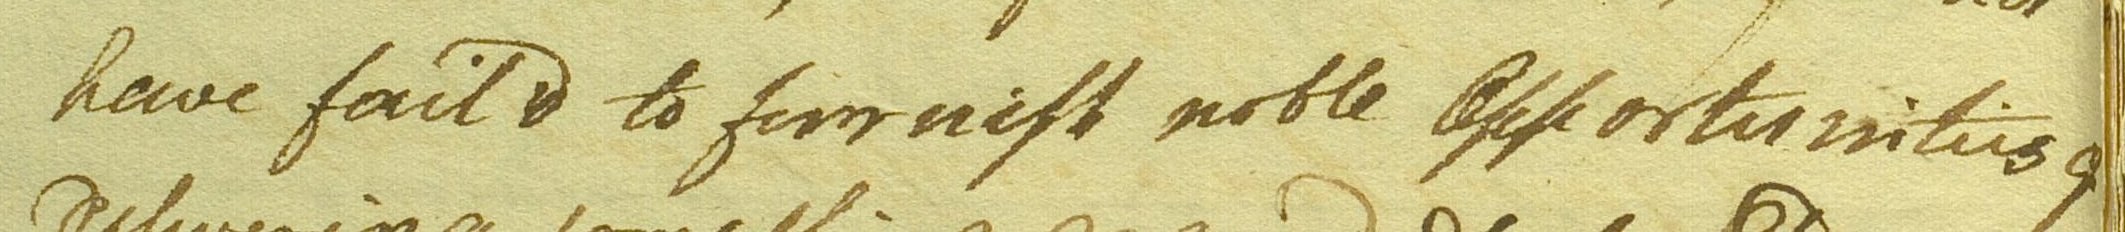have fail'd to furnish noble Opportunities,
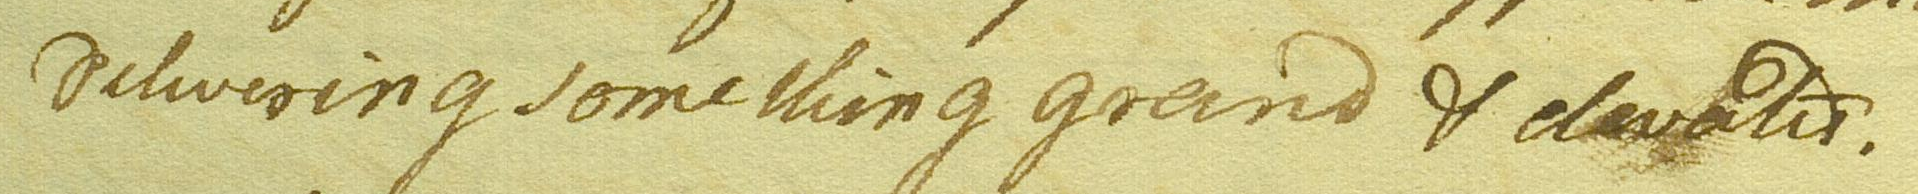delivering something grand & elevated.
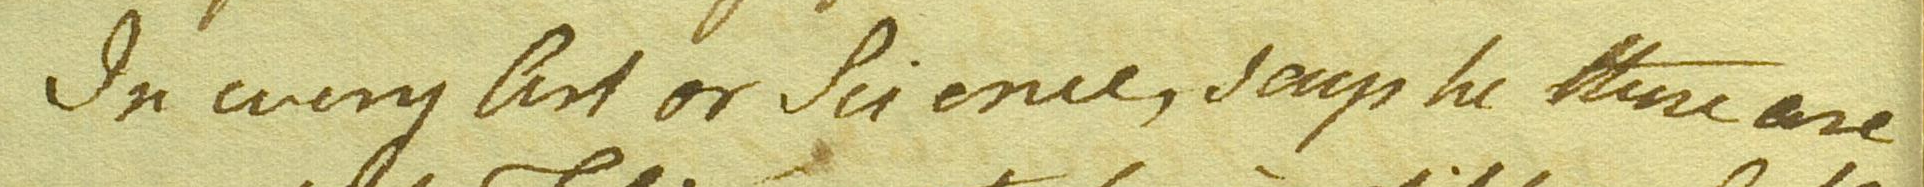In every Art or Science, says he there are
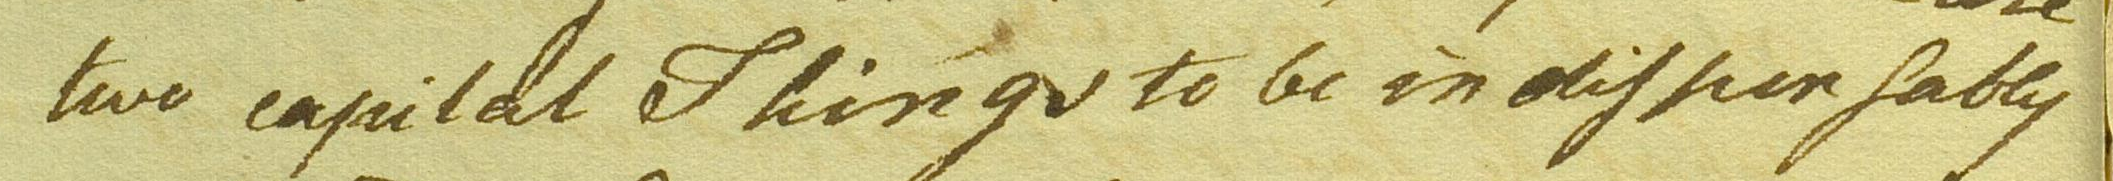two capital Things to be in dispersably
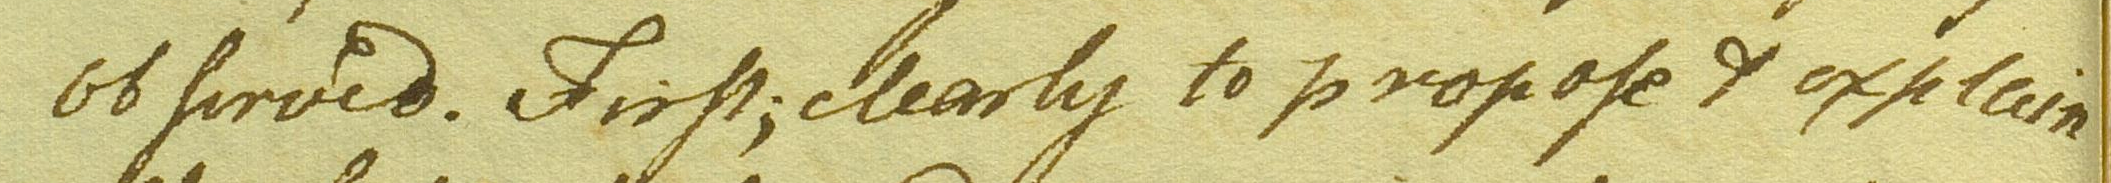observed. First; clearly to propose & explain
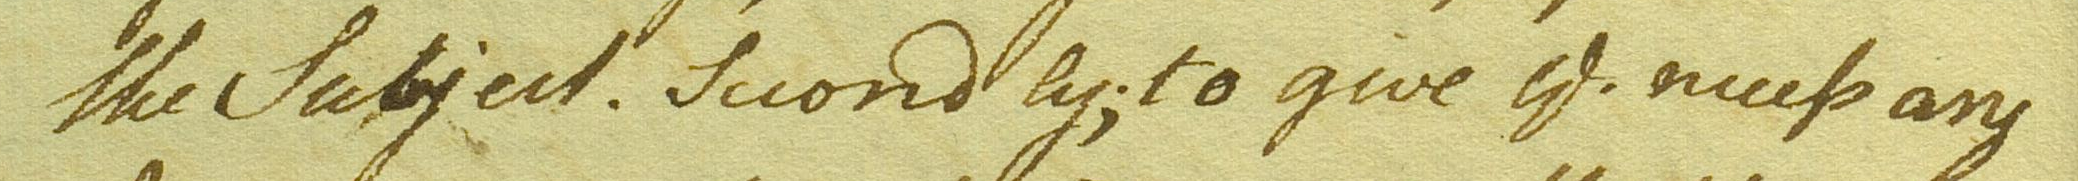the Subject. Secondly; to give y^e necessary
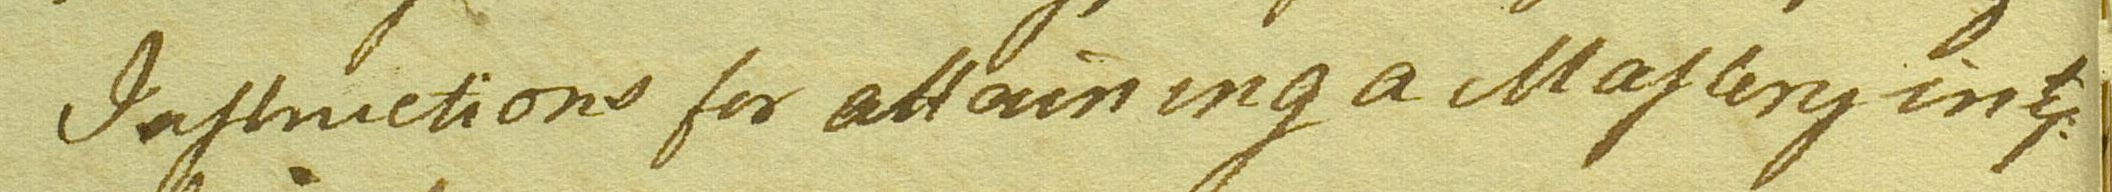Instructions for attaining a Mastery in y^t:
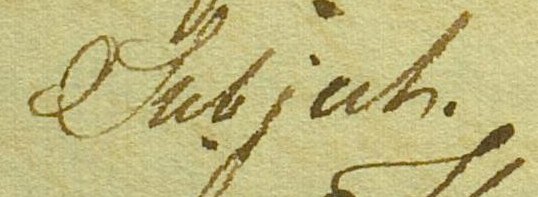Subject.
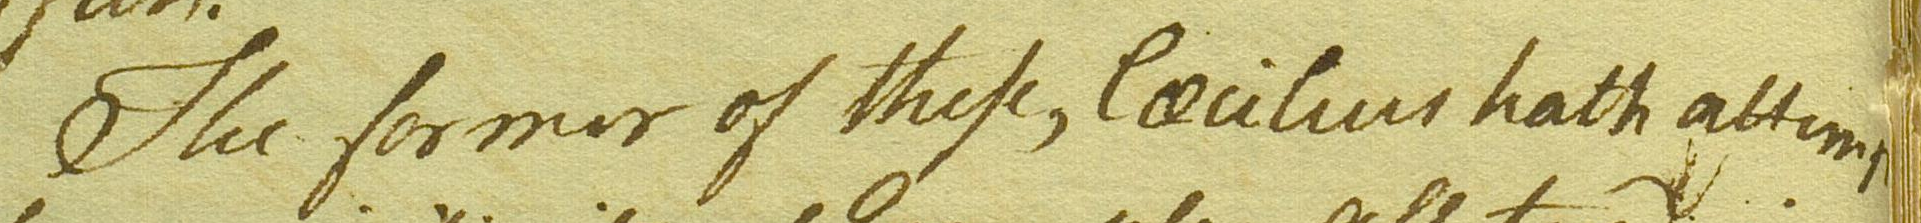The former of these, Caecilius hath attemp
